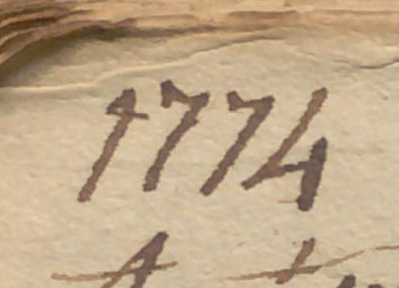1774
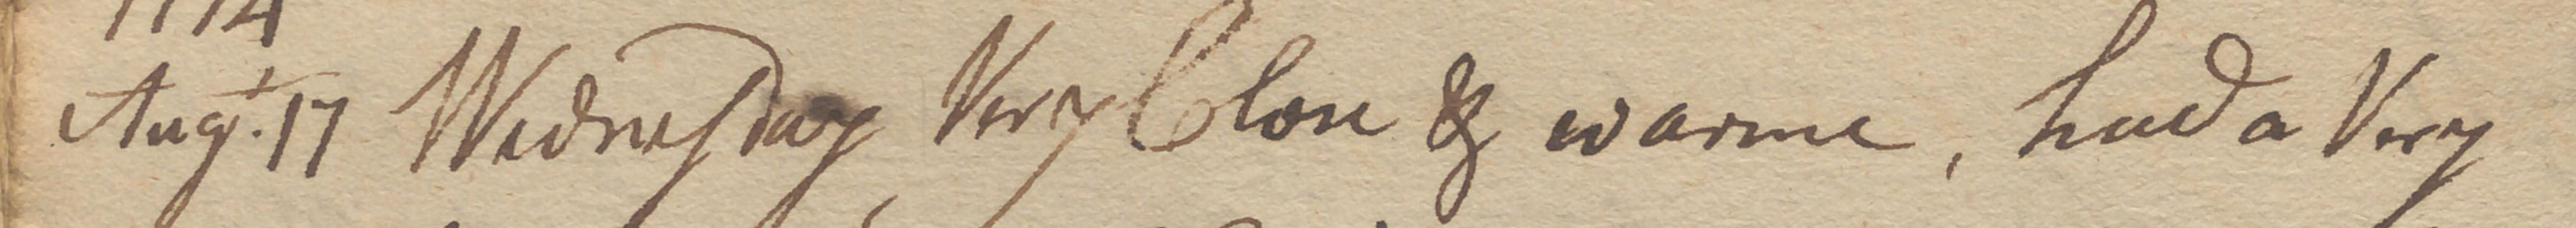Aug^t. 17 Wednesday Very Close & warme, had a Very
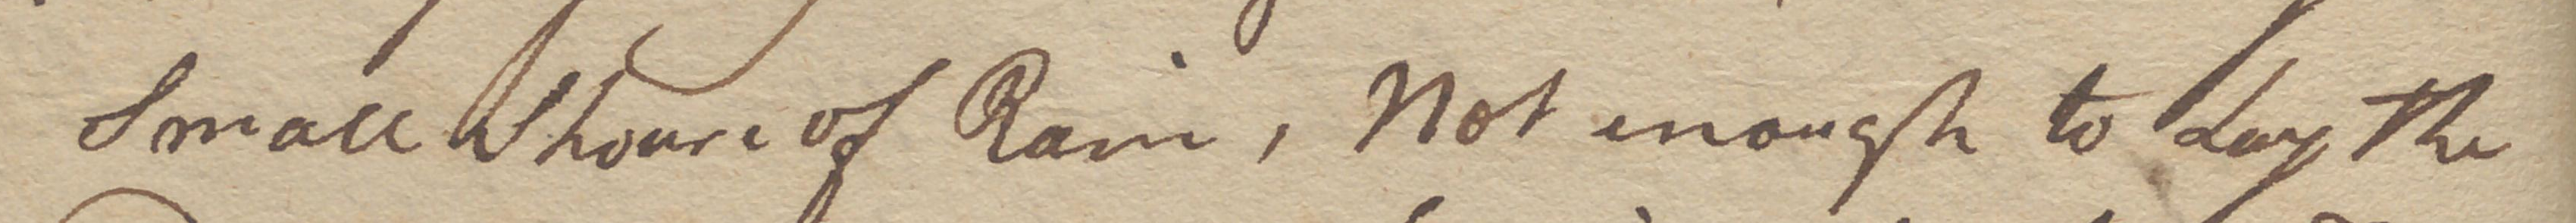small Shoure of Rain, Not enough to Lay the
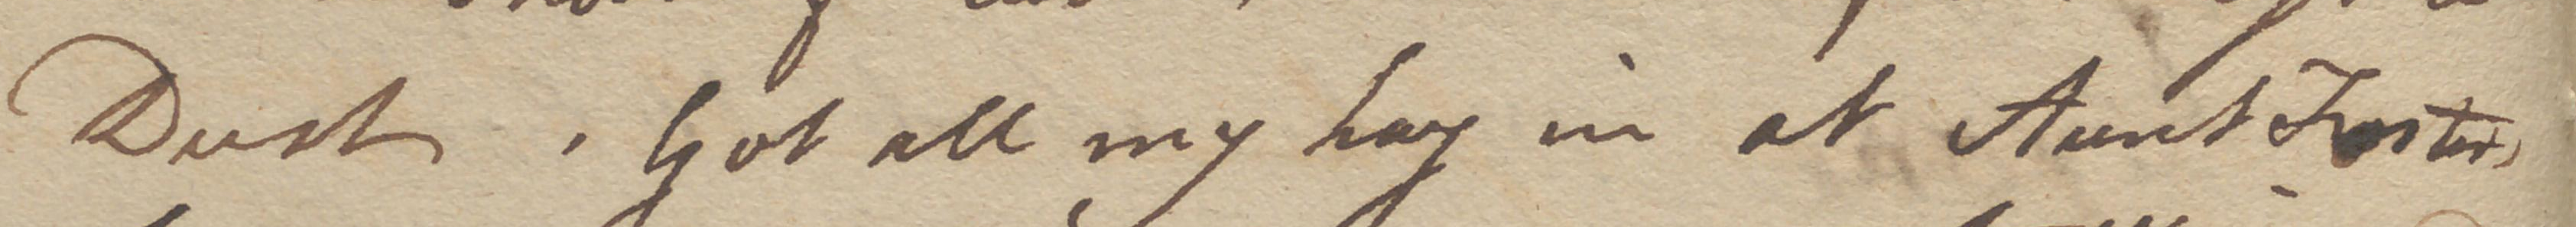Dust. Got all my hay in at Aunt Fosters
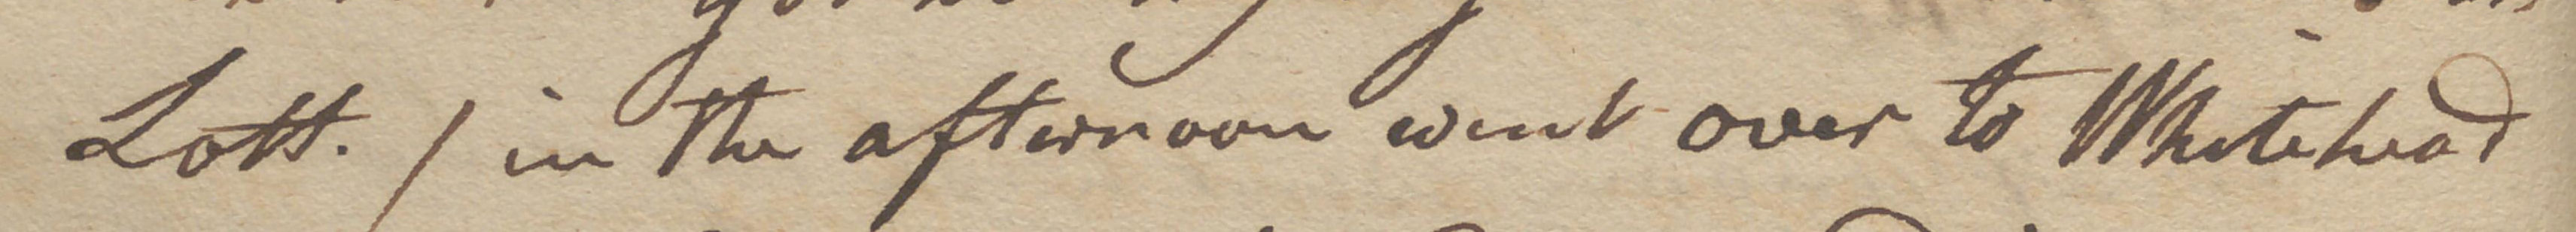Lott. / in the afternoon went over to Whitehead
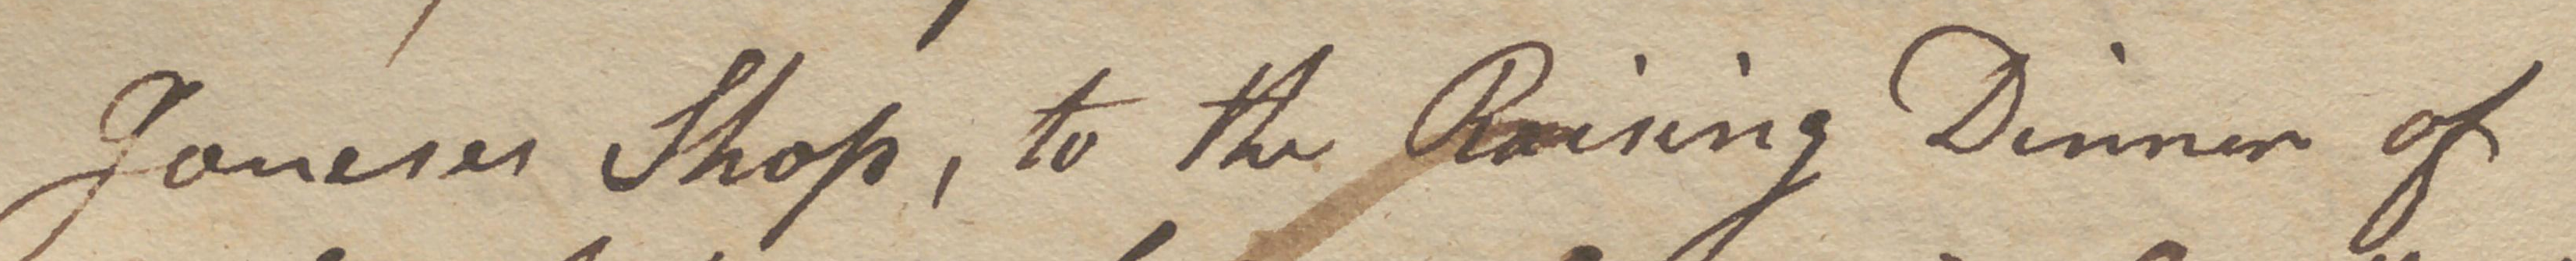Joneses Shop, to the Raising Dinner of
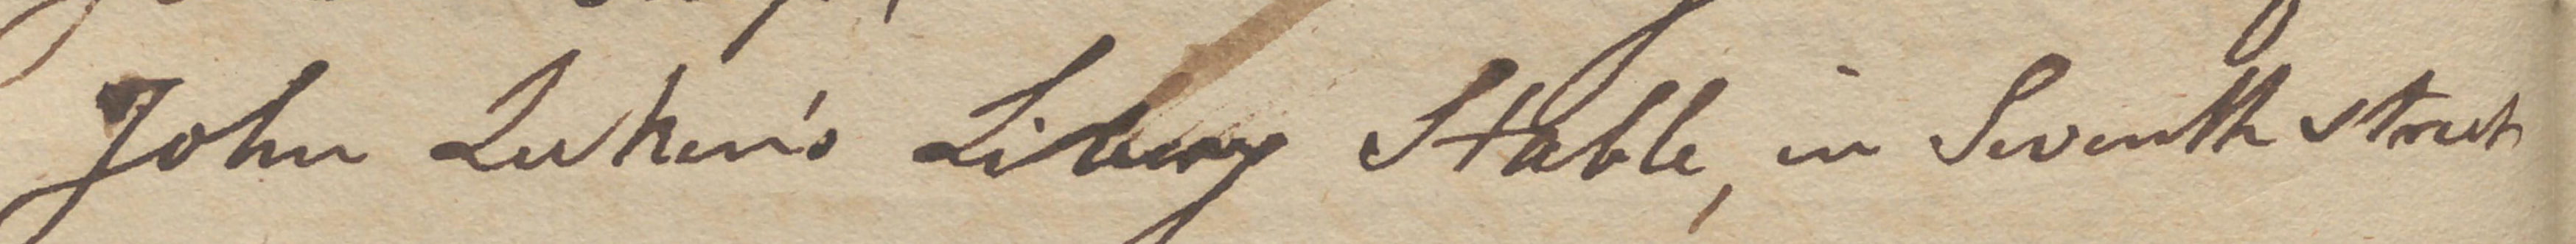John Luken's Libray Stable in Seventh street
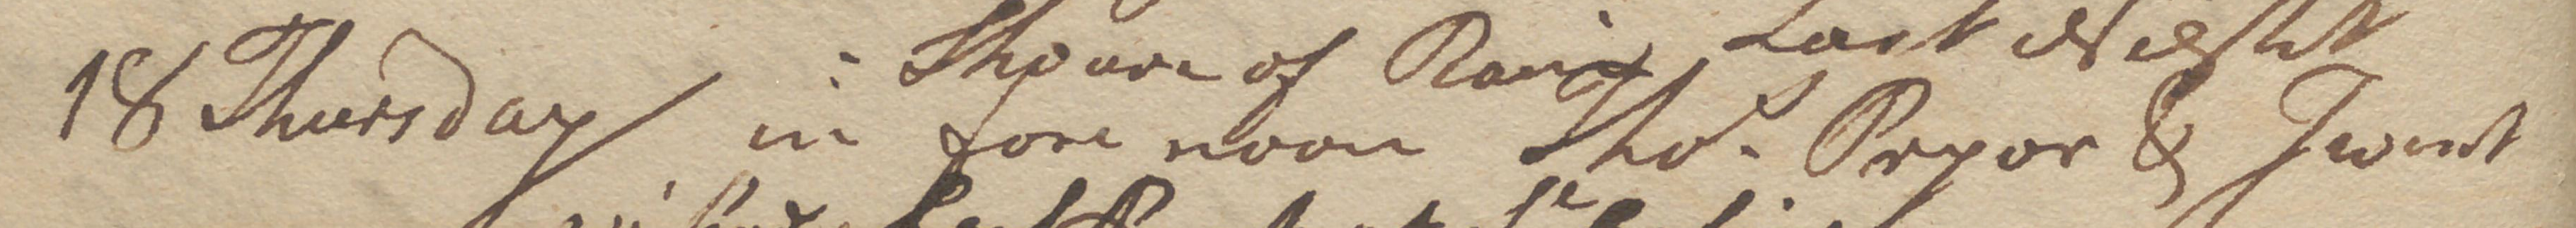18 Thursday in forenoon Tho^s. Pryor & I went
